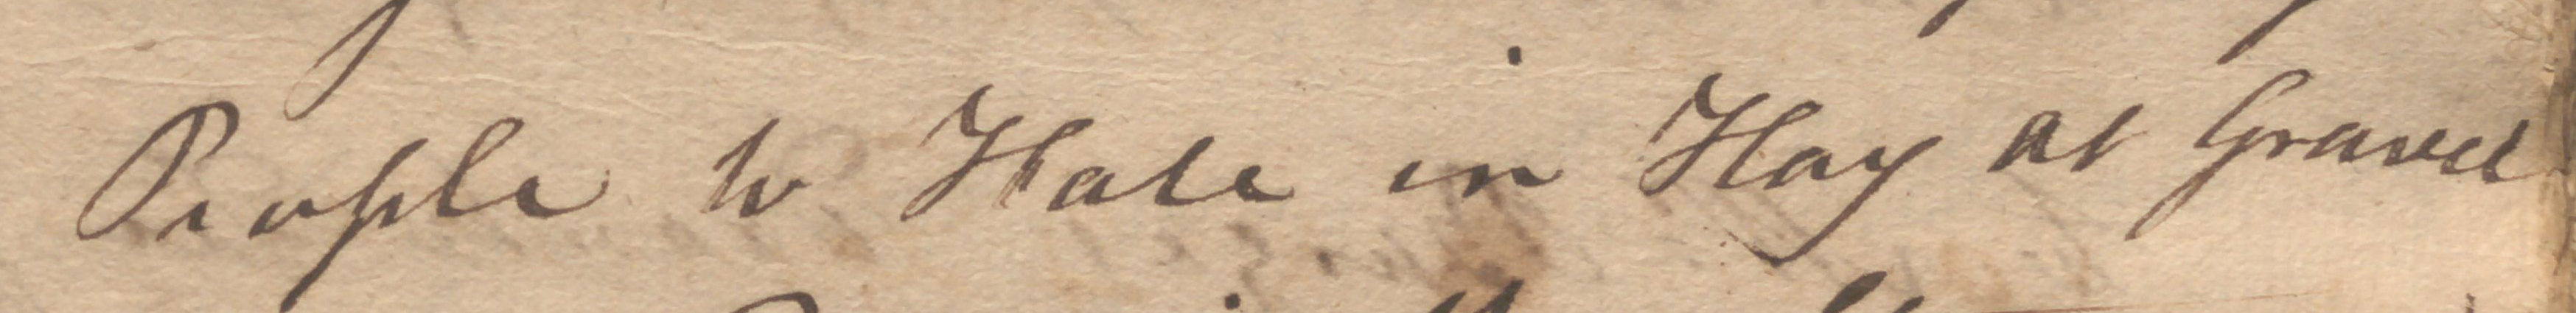People to Hale in Hay at Gravel
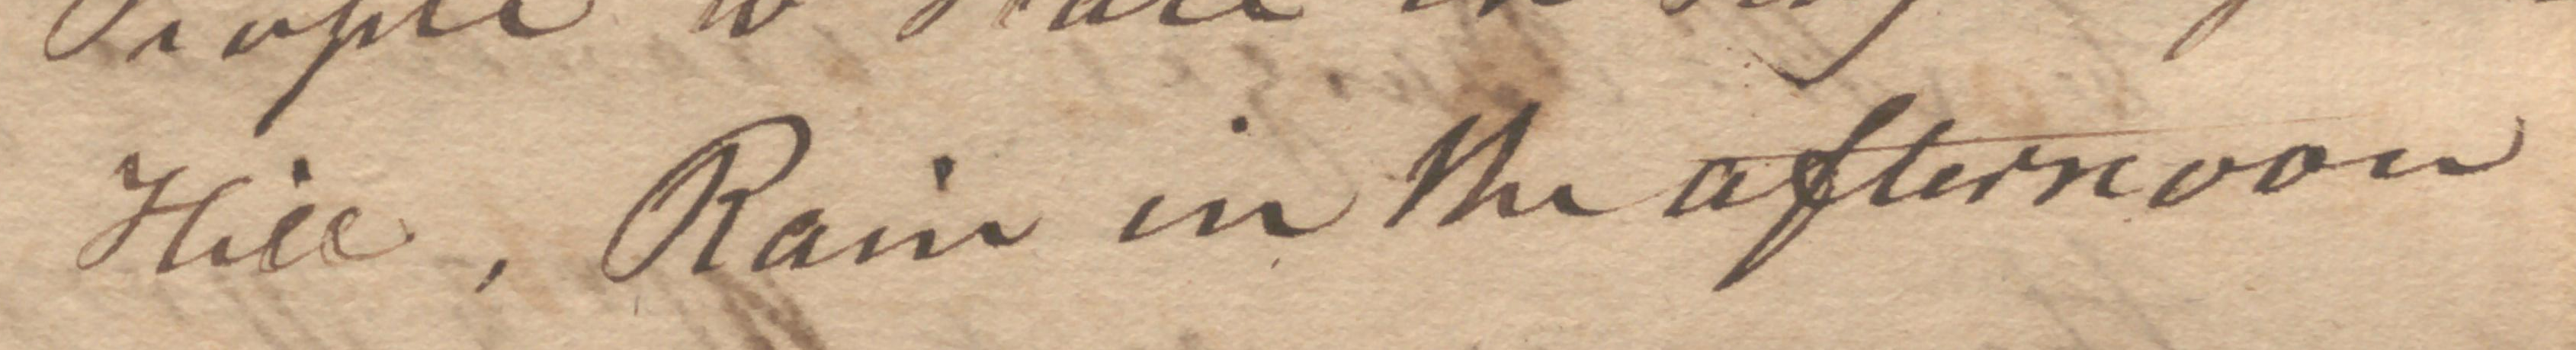Hill, Rain in the afternoon
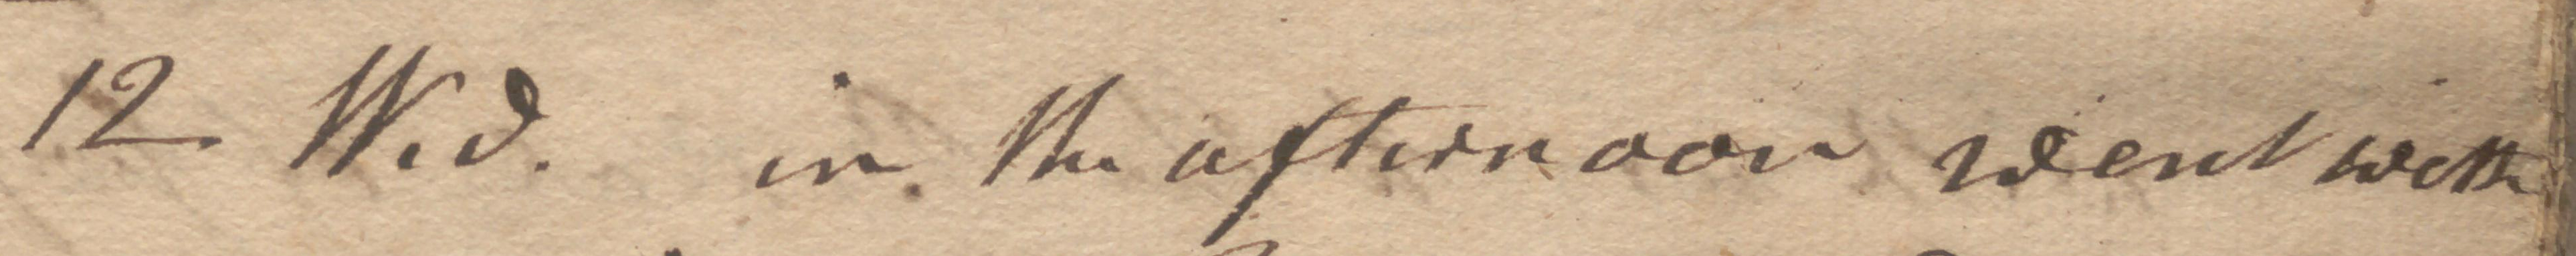12 Wed. in the afternoon went with
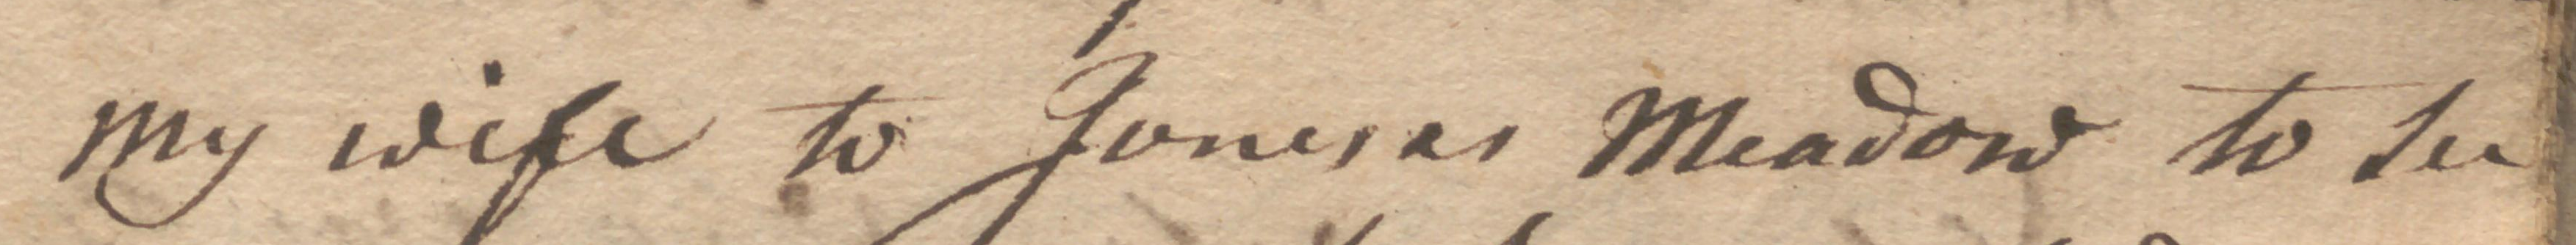my wife to Joneses Meadow to see
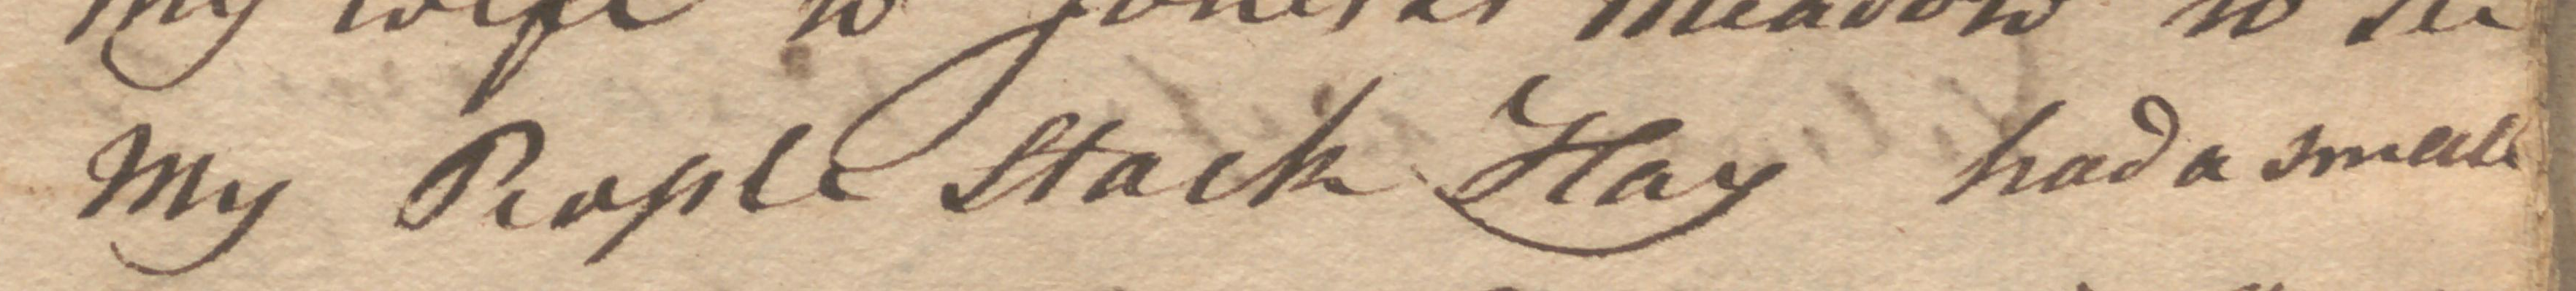My People Stack Hay had a small
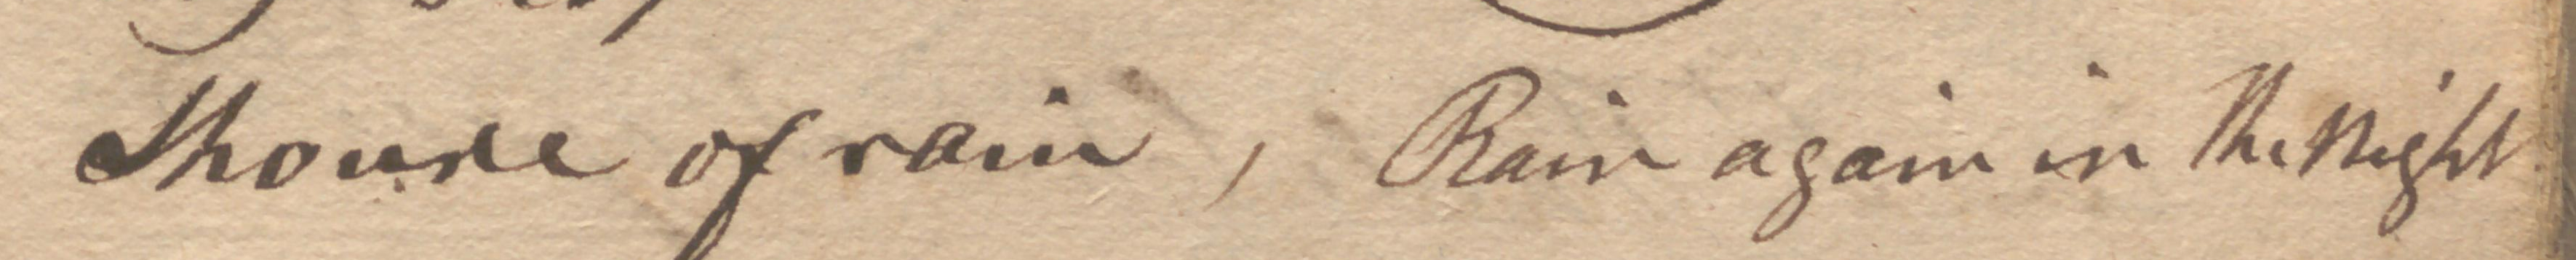shoure of rain, Rain again in the night
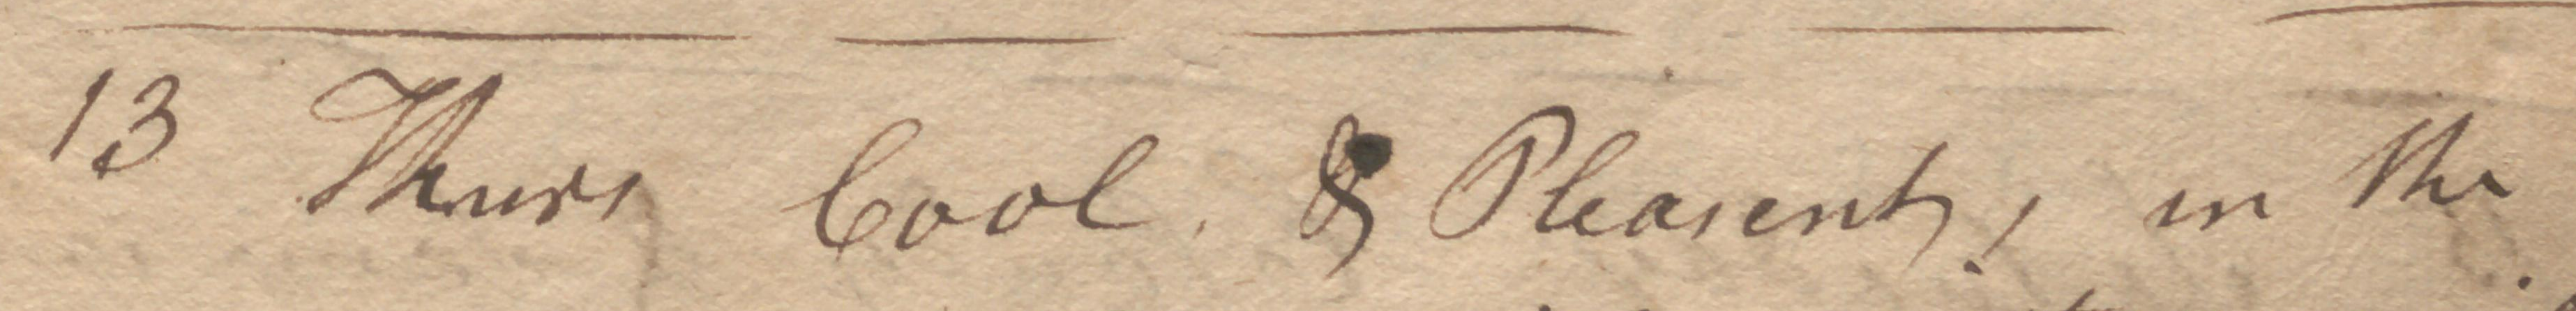13 Thurs Cool. & Pleasent, in the
